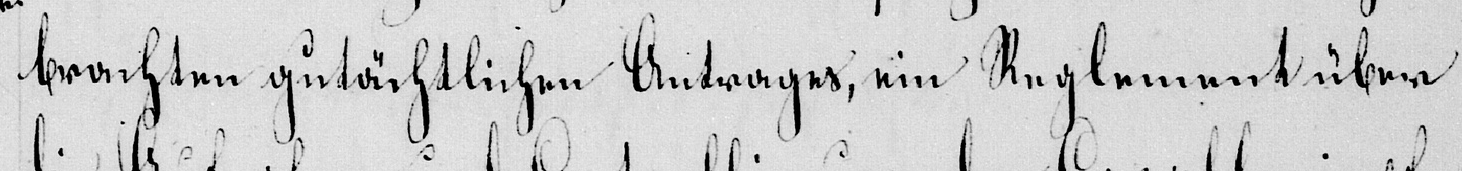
brachten gutächtlichen Antrages, ein Reglement über
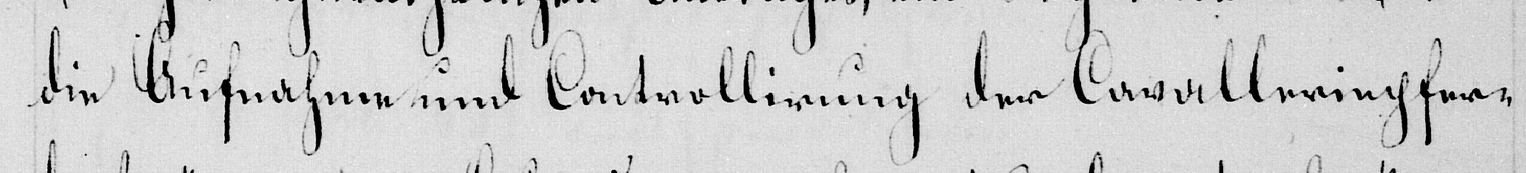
die Aufnahme und Controllirung der Cavalleriepfer¬
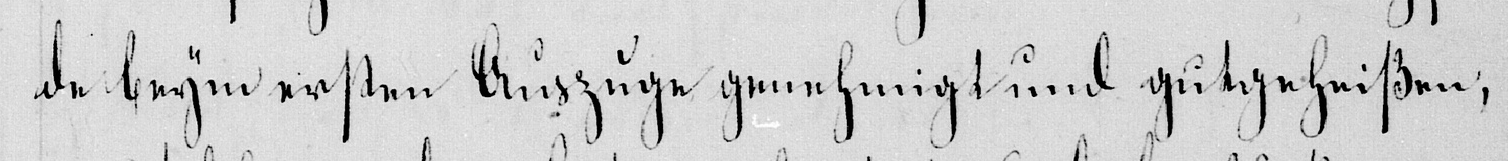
de beym ersten Auszuge genehmigt und gutgeheißen,
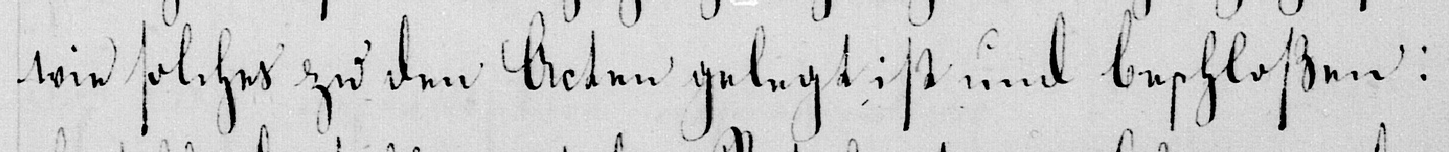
wie solches zu den Acten gelegt ist und beschloßen:
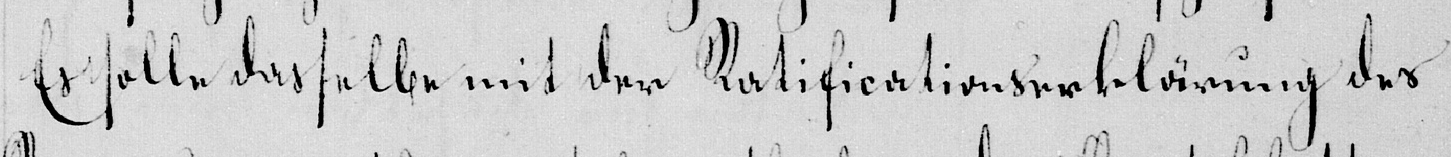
Es solle dasselbe mit der Ratificationserklärung des
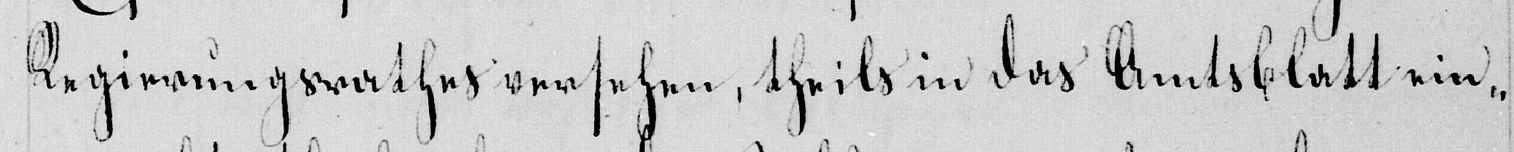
Regierungsrathes versehen, theils in das Amtsblatt ein¬
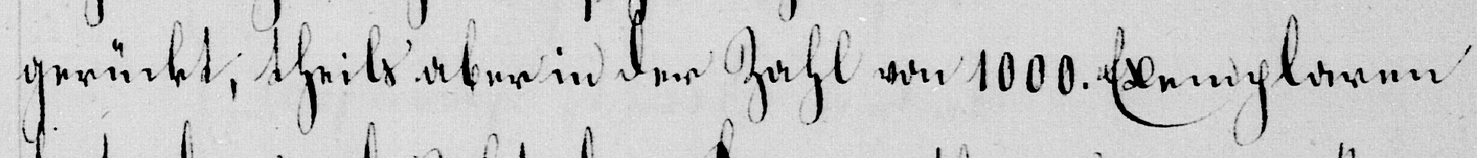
gerückt, theils aber in der Zahl von 1000. Exemplaren
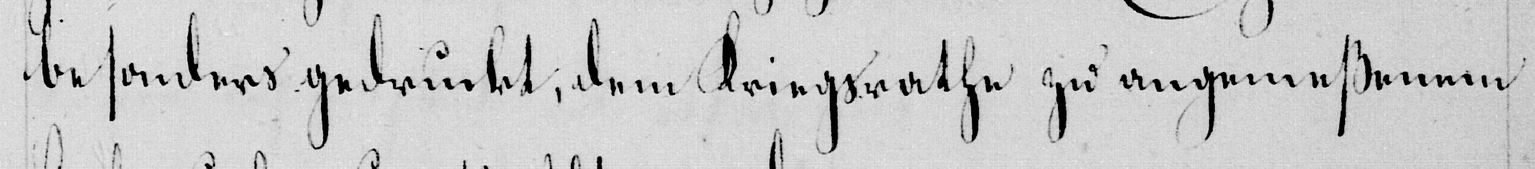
besonders gedruckt, dem Kriegsrathe zu angemeßenem
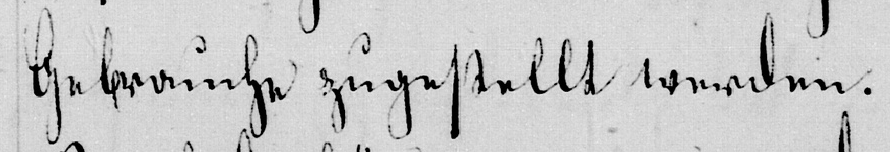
Gebrauche zugestellt werden.
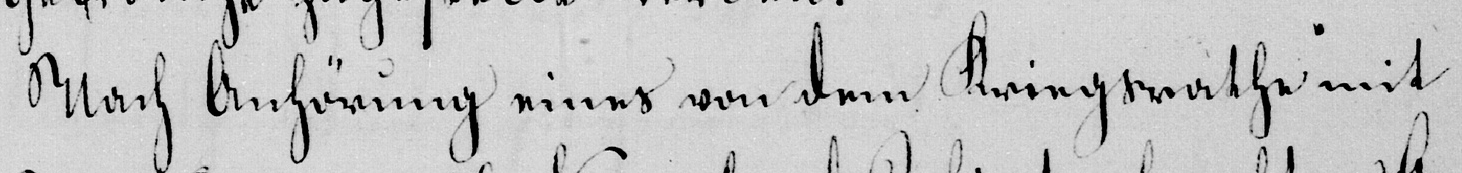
Nach Anhörung eines von dem Kriegsrathe mit
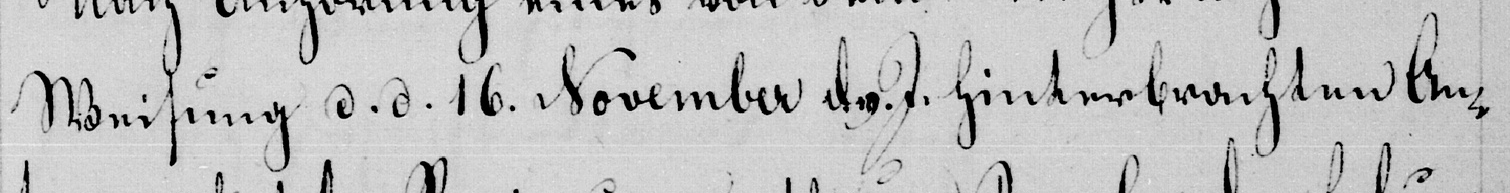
Weisung d. d. 16. November d. v. J. hinterbrachten An¬
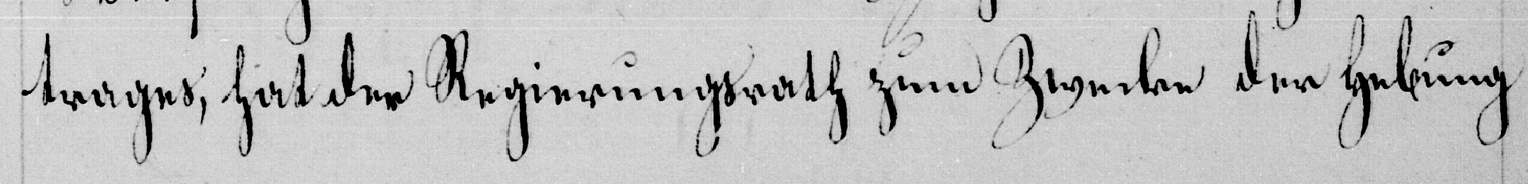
trages, hat der Regierungsrath zum Zwecke der Hebung
